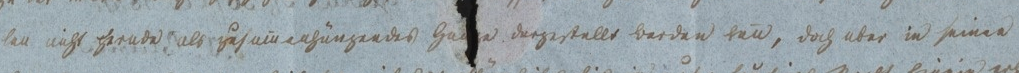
len nicht gerade als zusammenhängendes Ganze dargestellt werden kann, doch aber in seinen
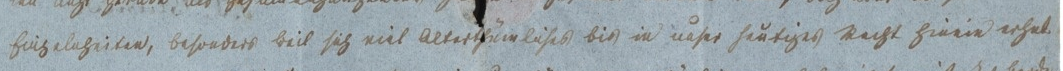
Einzelheiten, besonders weil sich viel Alterthümliches bis in unser heutiges Recht hinein erhal-
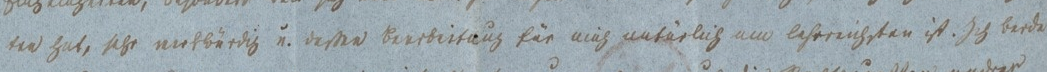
ten hat, sehr merkwürdig u. dessen Bearbeitung für mich natürlich am lehrreichsten ist. Ich werde
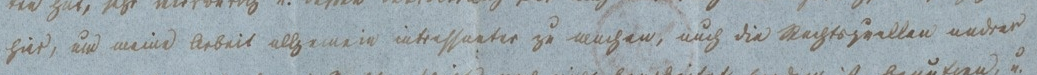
hier, um meine Arbeit allgemein intressanter zu machen, auch die Rechtsquellen andrer
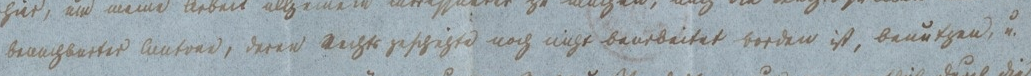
benachbarter Cantone, deren Rechtsgeschichte noch nicht bearbeitet worden ist, benutzen, u.
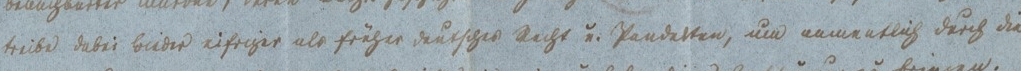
treibe dabei wieder eifriger als früher deutsches Recht u. Pandekten, um namentlich durch die
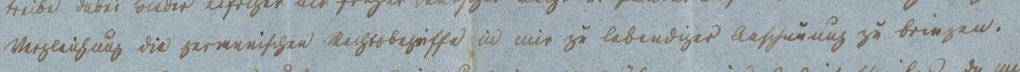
Vergleichung die germanischen Rechtsbegriffe in mir zu lebendiger Anschauung zu bringen.
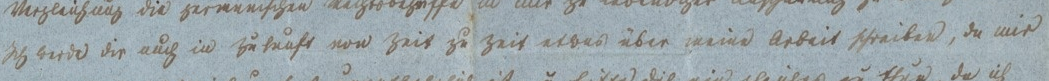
Ich werde dir auch in Zukunft von Zeit zu Zeit etwas über meine Arbeit schreiben, da mir
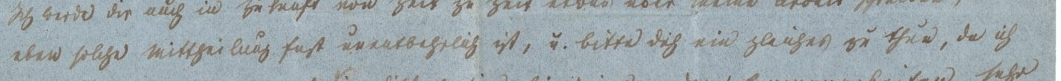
eben solche Mittheilung fast unentbehrlich ist, u. bitte dich ein gleiches zu thun, da ich
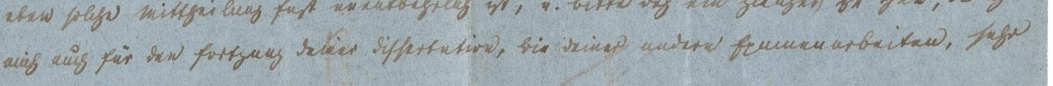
mich auch für den Fortgang deiner Dissertation, wie deiner andern Examensarbeiten, sehr
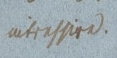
intressire.
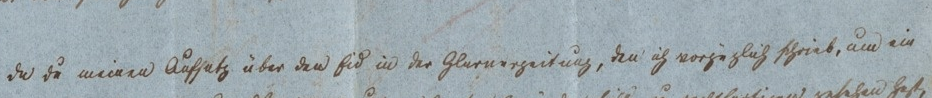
Da du meinen Aufsatz über den Eid in der Glarnerzeitung, den ich vorzüglich schrieb, um ein
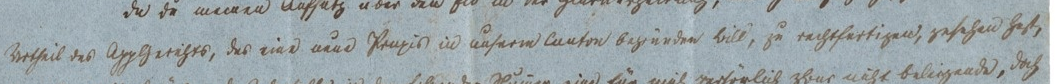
Urtheil des AppGerichts, das eine neue Praxis in unserm Canton begründen will, zu rechtfertigen, gesehen hast,
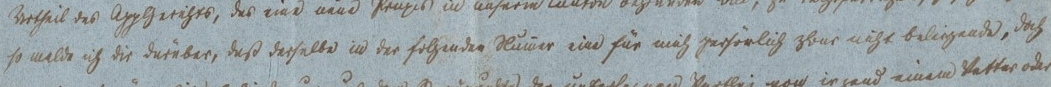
so melde ich dir darüber, daß derselbe in der folgenden Nummer eine für mich persönlich zwar nicht beleigende, doch
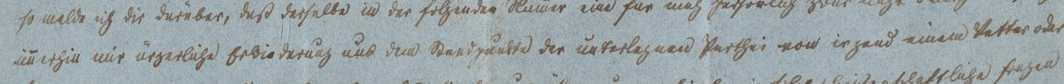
immerhin mir ärgerliche Erwiederung aus dem Standpunkte der unterlegnen Parthei von irgend einem Vetter oder
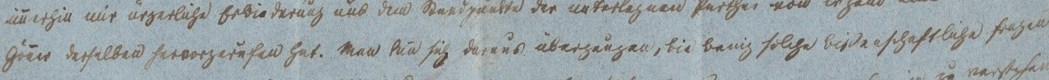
Gönner derselben hervorgerufen hat. Man kann sich daraus überzeugen, wie wenig solche wissenschaftliche Fragen
